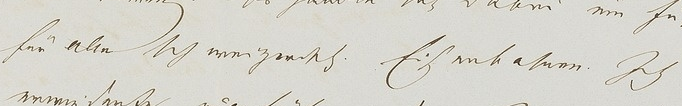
für alle schweizerisch. Eisenbahnen. Ich
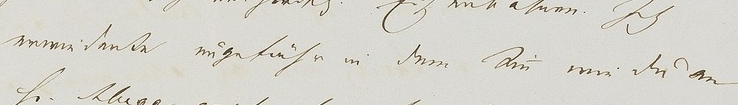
erwiederte ungefähr in dem Sinn wie du an
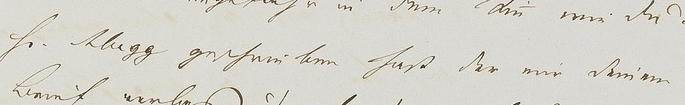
Hr. Abegg geschrieben hast der mir deinen
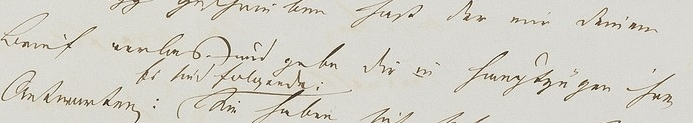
Brief vorlas und gebe dir in Hauptzügen ihre
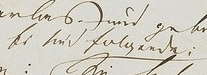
Es sind folgende:
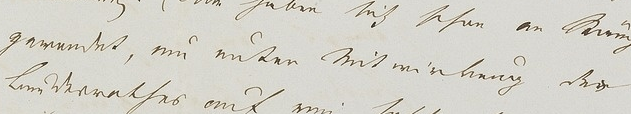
gewendet, um unter Mitwirkung des
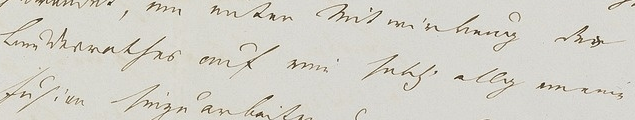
Bundesrathes auf eine solch' allgemeine
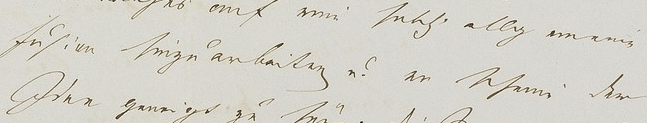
Fusion hinzuarbeiten u. er scheine der
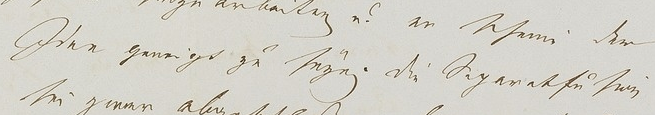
Idee geneigt zu seyn. Die Separatfusion
